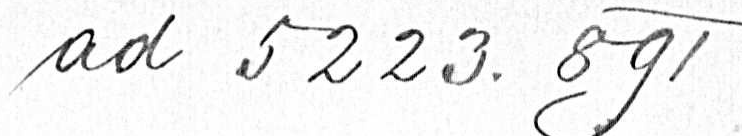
ad 5223 891
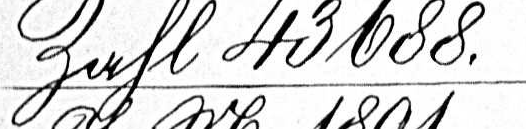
Zahl 43688
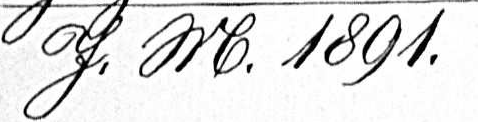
JM 1891
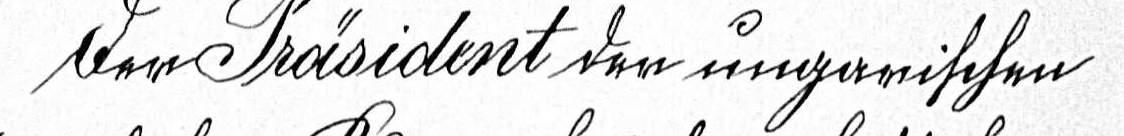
Der Präsident der ungarischen
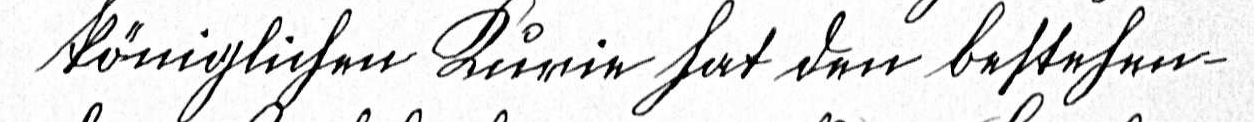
königlichen Kurie hat den bestehen¬
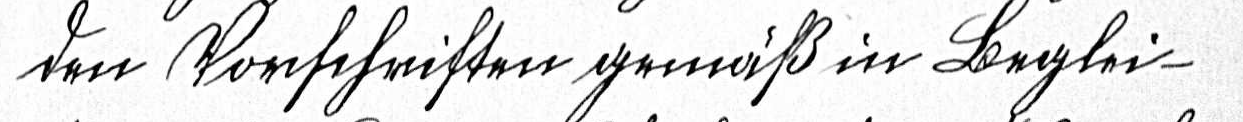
den Vorschriften gemäß in Beglei¬
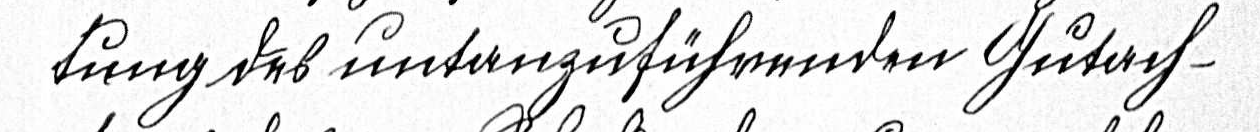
tung des untanzuführenden Gutach¬
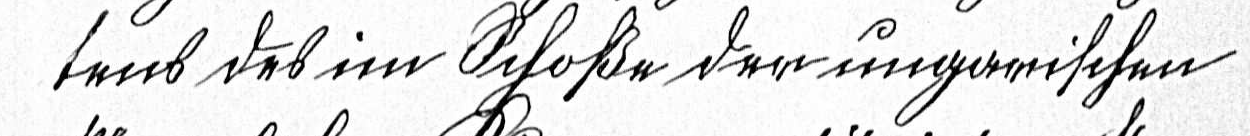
tens des im Schloße der ungarischen
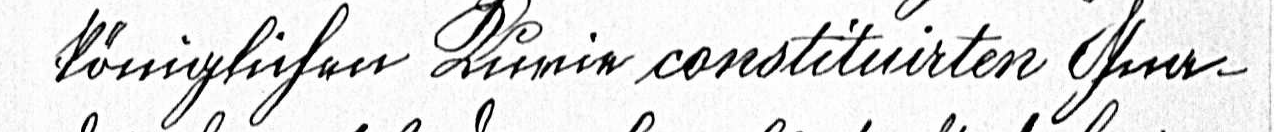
königlichen Kurie constituirten Gna¬
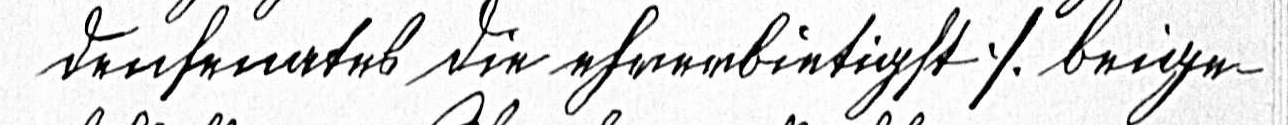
densenates die ehrerbietigst % beige¬
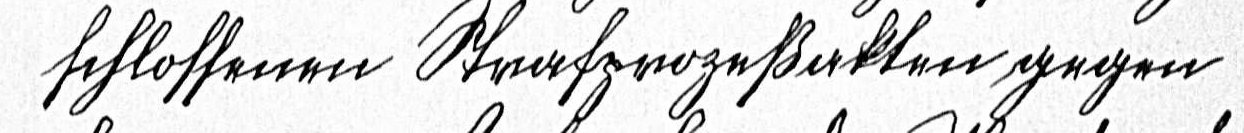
schlossenen Strafprozeßakten gegen
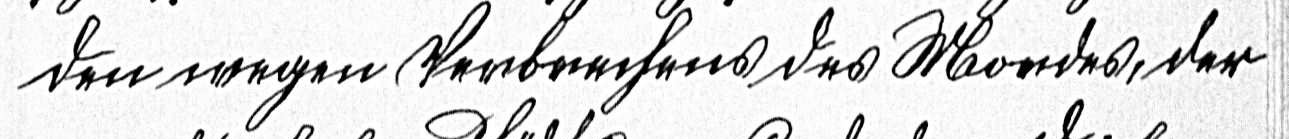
den wegen Verbrechens des Mordes, der
